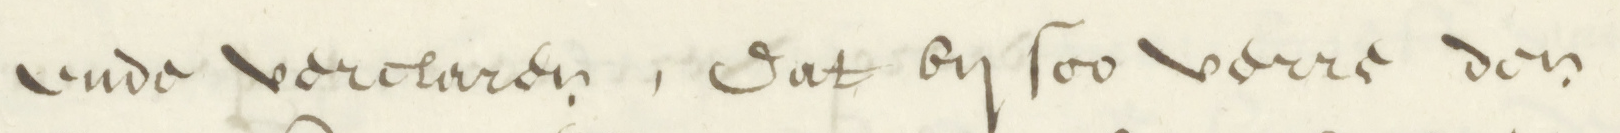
ende verclaren, dat by soo verre den
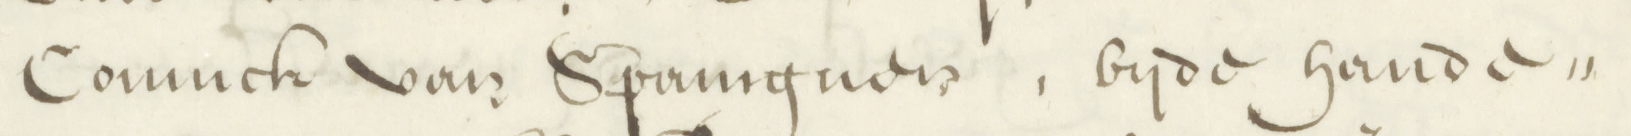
Coninck van Spaingnen, byde hande,,
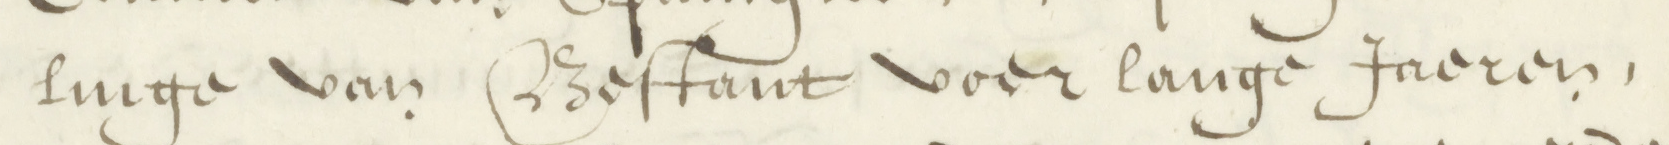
linge van Bestant voer lange Jaeren,
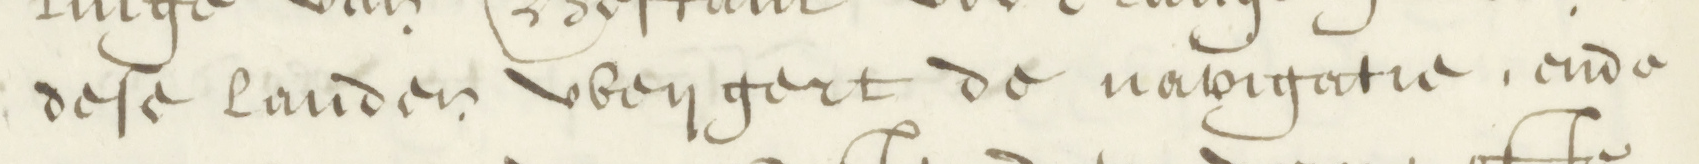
dese landen weygert de navigatie, ende
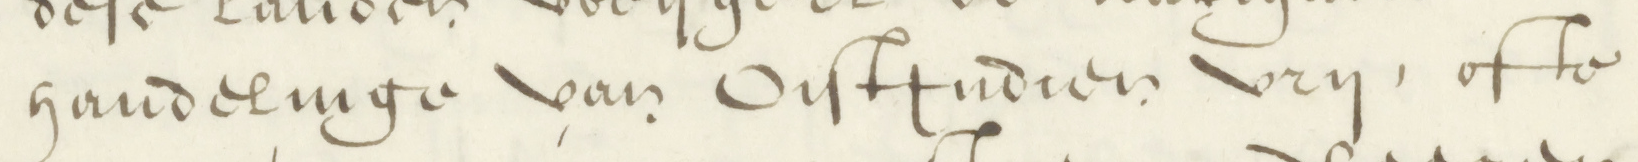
handelinge van OistIndien vry, ofte
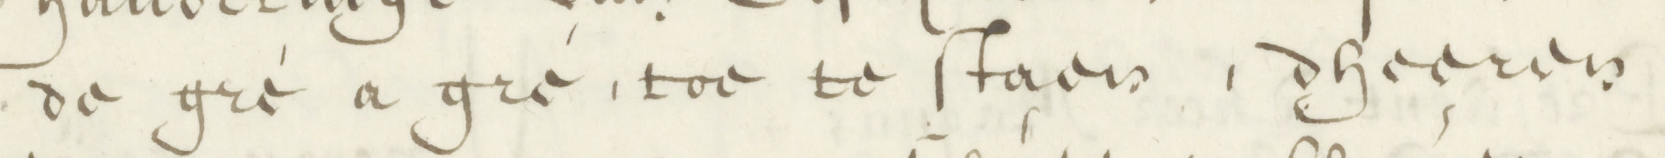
de gré a gré, toe te staen, dheeren
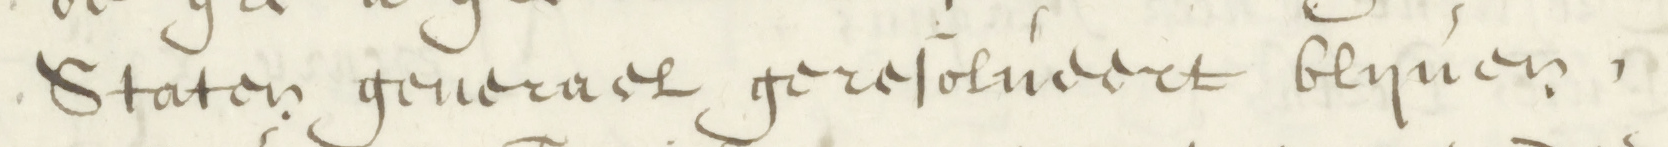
Staten generael geresolueert blyuen,
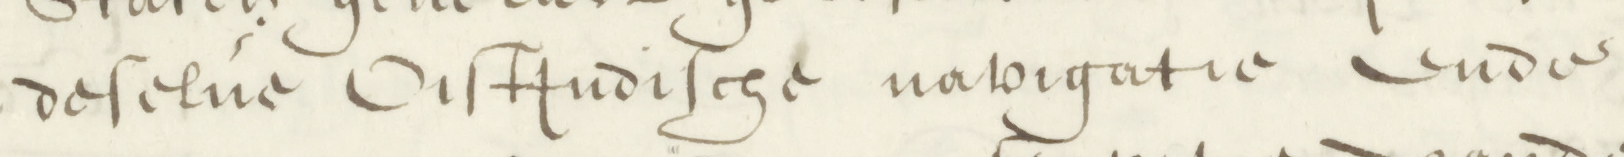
deselue OistIndische navigatie ende
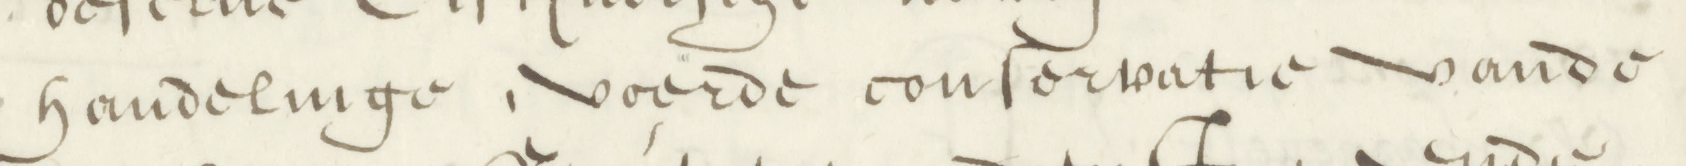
handelinge, voerde conservatie vande
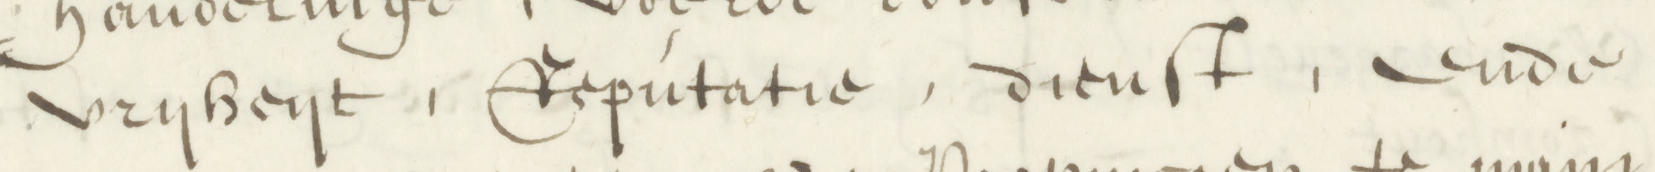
vryheyt, Reputatie, dienst, ende
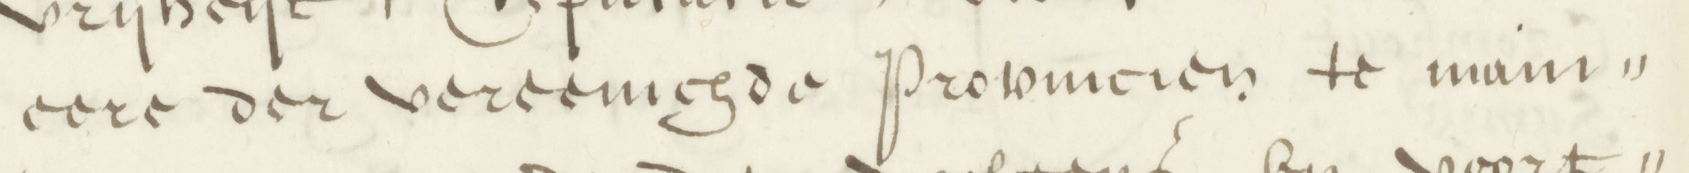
eere der vereenichde Provincien te main,,
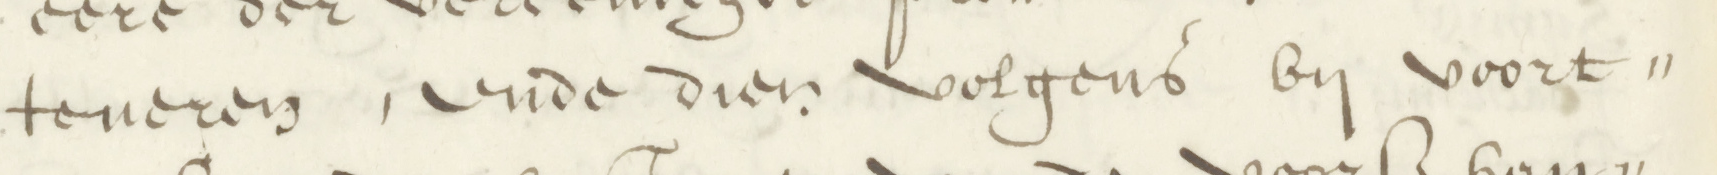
teneren, ende dien volgens by voort,,
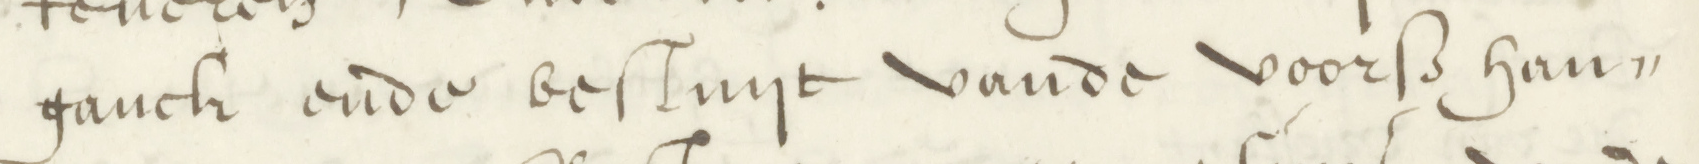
ganck ende besluyt vande voors han,,
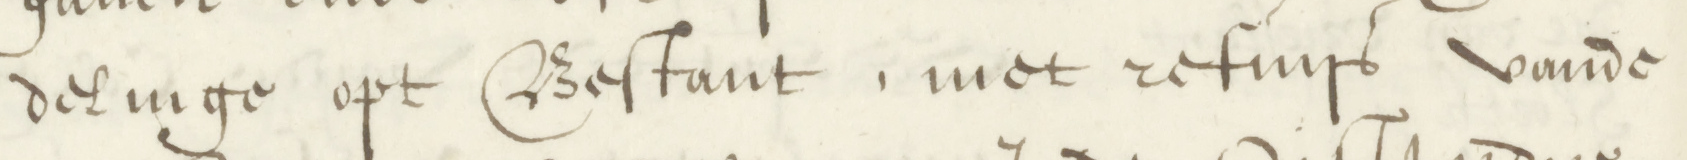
delinge opt Bestant, met refuys vande
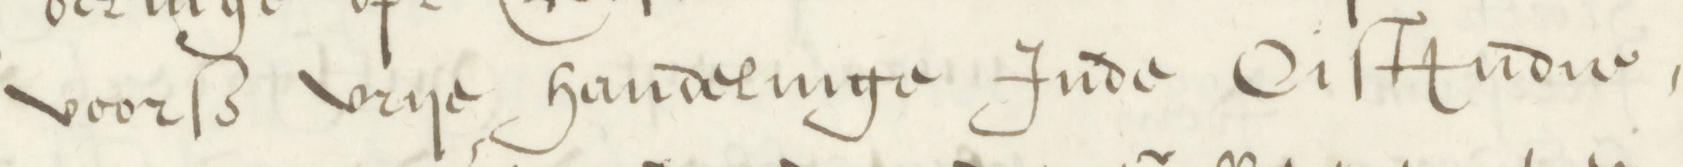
voors vrye handelinge Inde OistIndie,
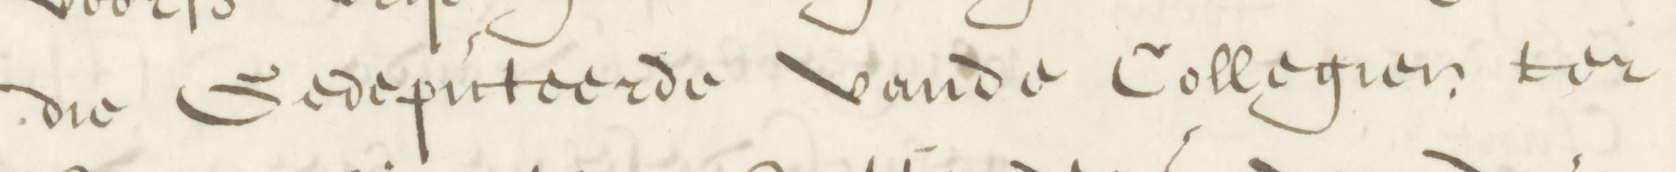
die Gedeputeerde vande Collegien ter
